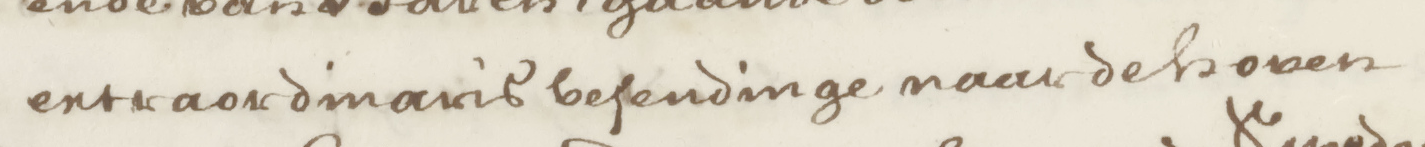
extraordinaris besendinge naar de hoven
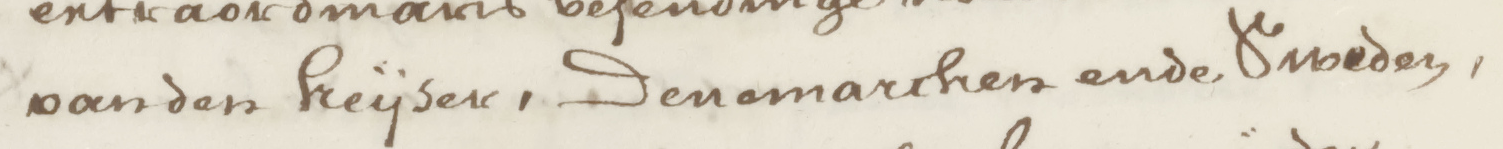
van den keijser, Denemarcken ende Sweden,
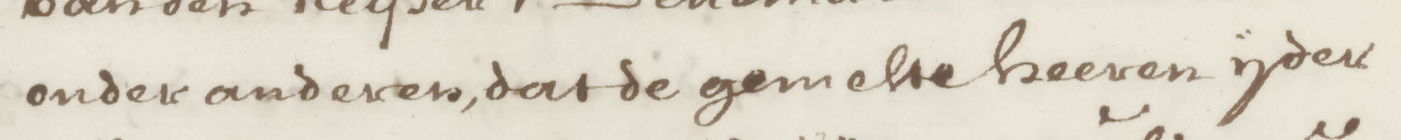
onder anderen, dat de gemelte heeren ijder
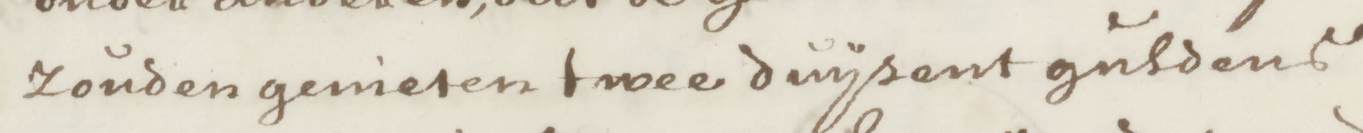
zouden genieten twee duijsent guldens
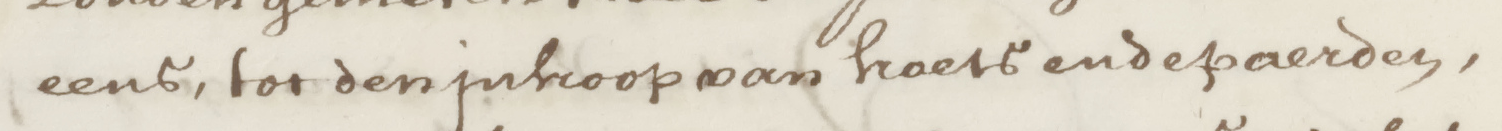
eens, tot den inkoop van koets ende paerden,
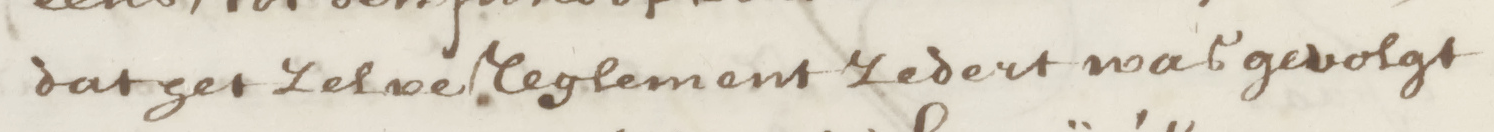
dat het zelve reglement zedert was gevolgt
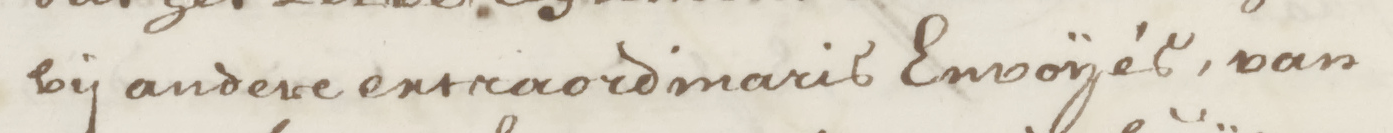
bij andere extraordinaris Envoijés, van
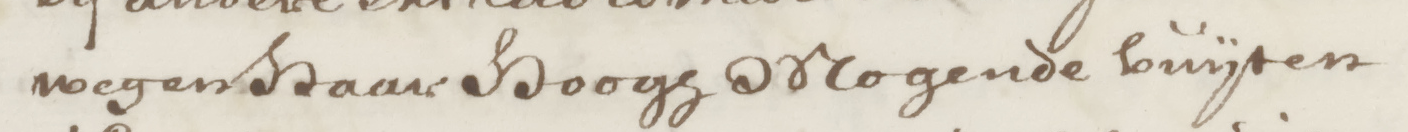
wegen haar Hoogh Mogende buijten
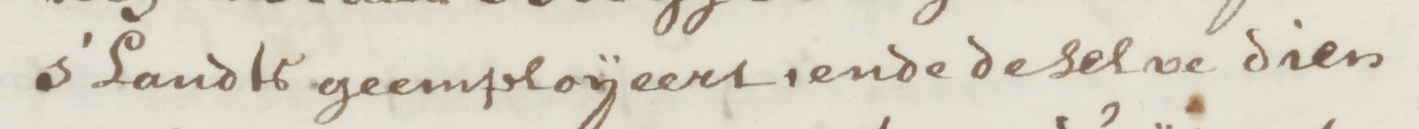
s'Landts geemploijeert, ende deselve dien
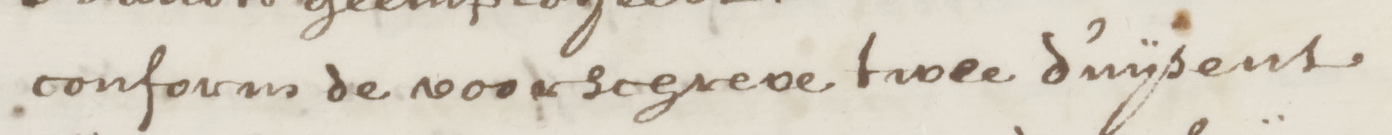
conform de voorschreve twee duijsent
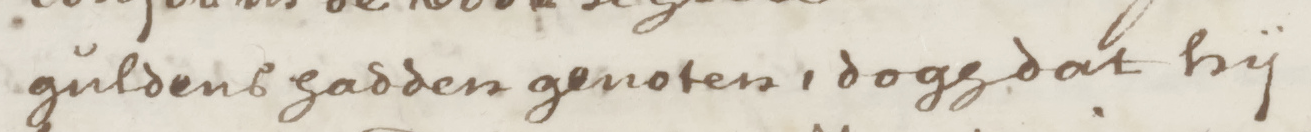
guldens hadden genoten, dogh dat hij
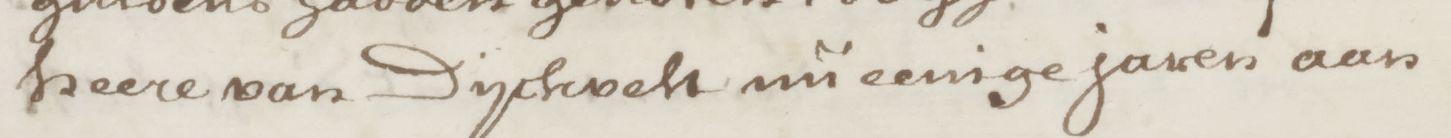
heere van Dijckvelt nu eenige jaren aan
